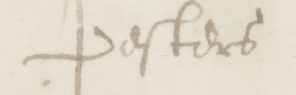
Pesters
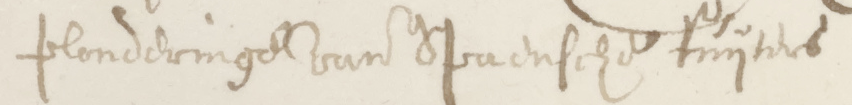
plonderinge van Spaensche Ruijters
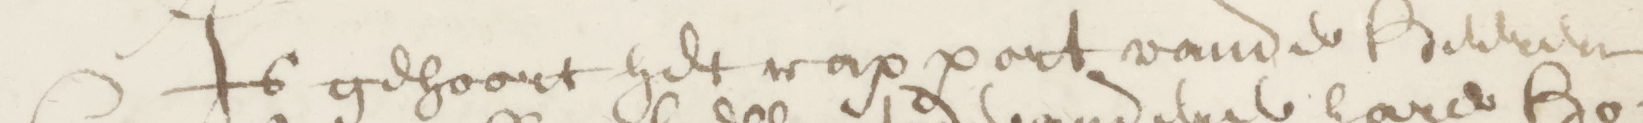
Is gehoort het rapport vande Heeren
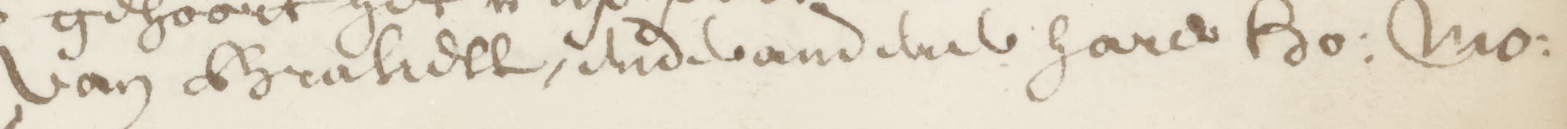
van Brakell, ende andere hare Ho:Mo:
